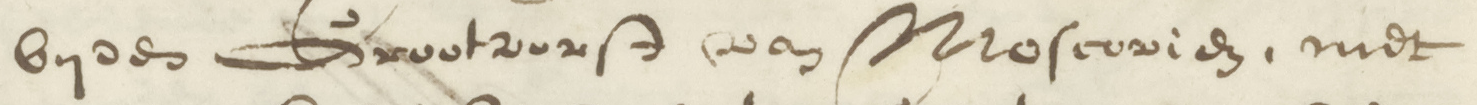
by den Grootvorst van Moscovien, met
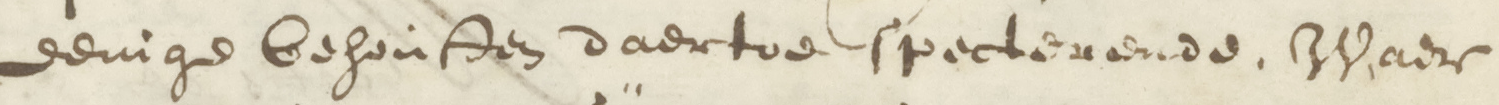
eenige behouften daertoe specterende. Waer
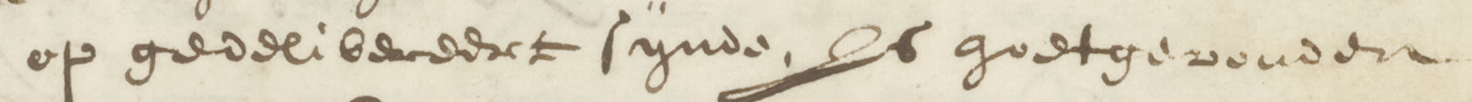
op gedelibereert sijnde, Is goetgevonden
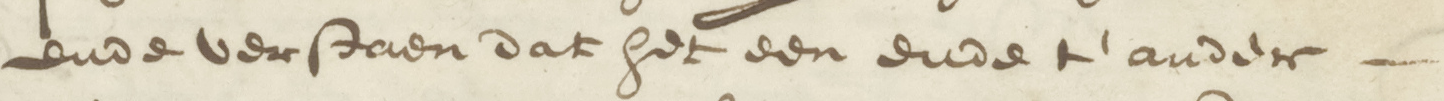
ende verstaen dat het een ende t‛ ander ¬
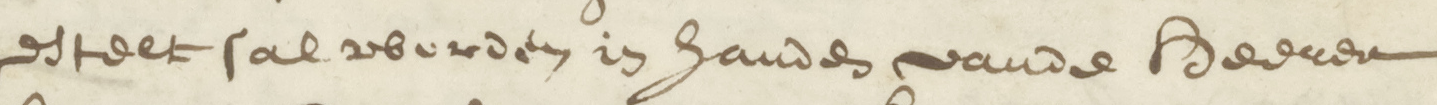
gestelt sal worden in handen vande Heeren
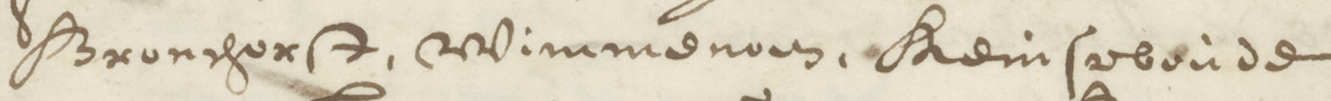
Bronchorst, Wimmenem, Reinswoude,
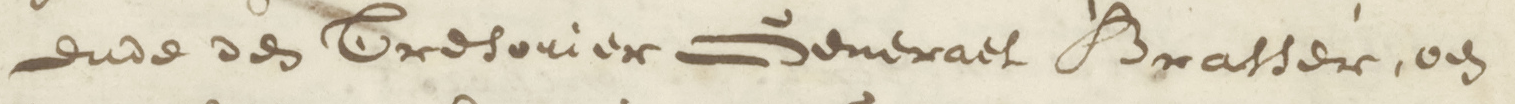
ende den Tresorier Generael Brasser, om
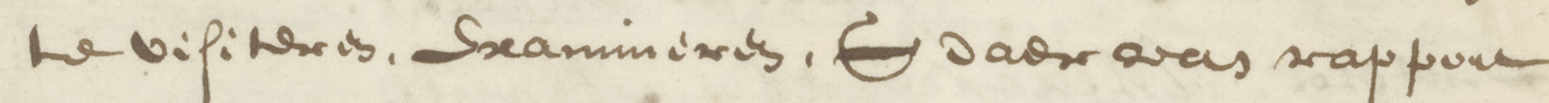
te visiteren, Examineren, & daer van rapport
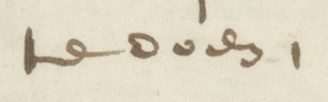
te doen.
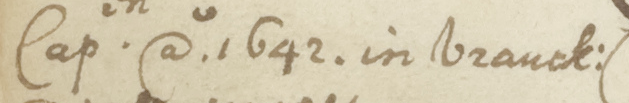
Capen. ao. 1642 in Vranck:
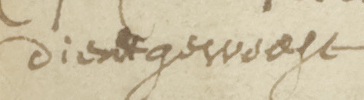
dienst geweest
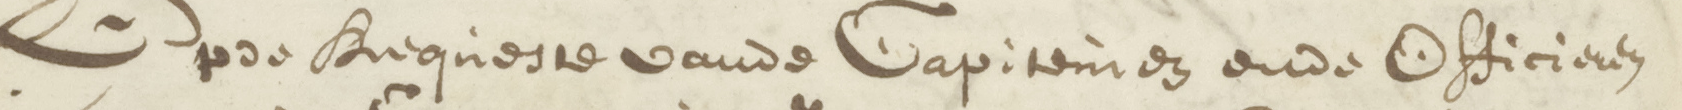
Opde Requeste vande Capiteinen ende Officieren
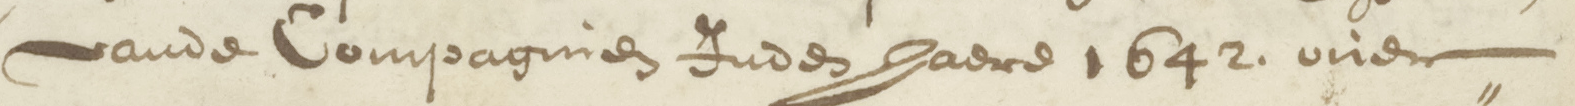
vande Compagnien Inden jaere 1642 over„
